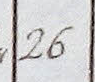26
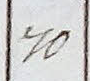70
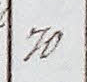70
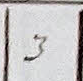3
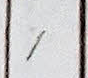1
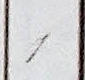1
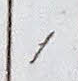1
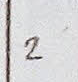2
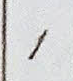1
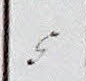5
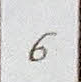6
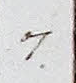7
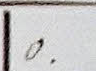0.
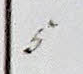5
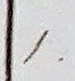1
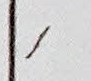1
